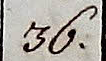36.
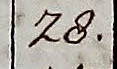28.
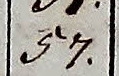57.
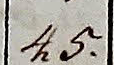45.
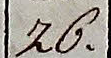26.
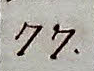77
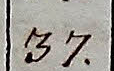37.
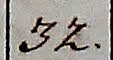32.
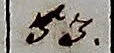53.
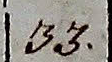33.
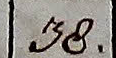38.
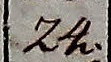24
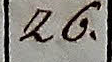26.
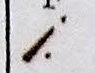1.
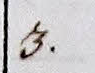3.
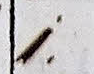1.
